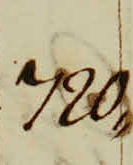720
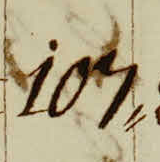107
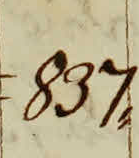837
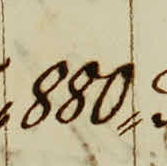880
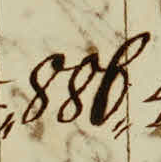886
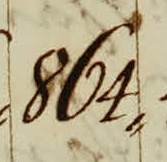864
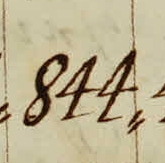844
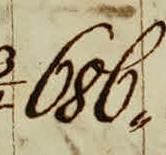686
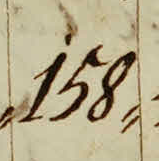158
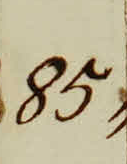85
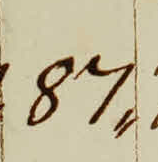87
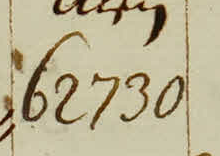62730
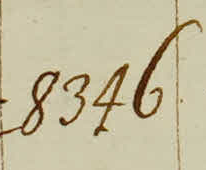8346
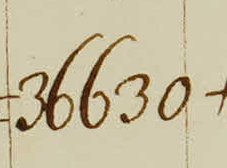36630
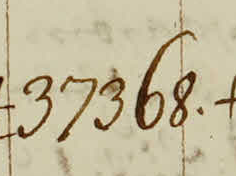37368.
